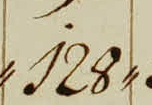128
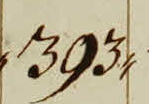393
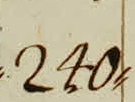240
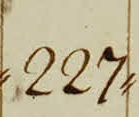227
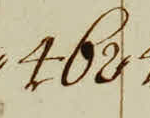462
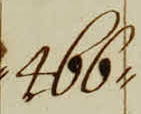466
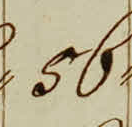56
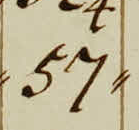57
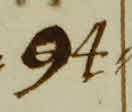94
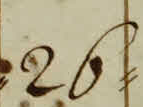26
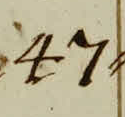47
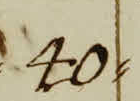40
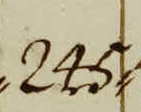245
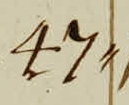47
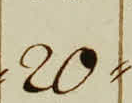20
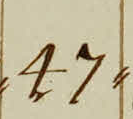47
